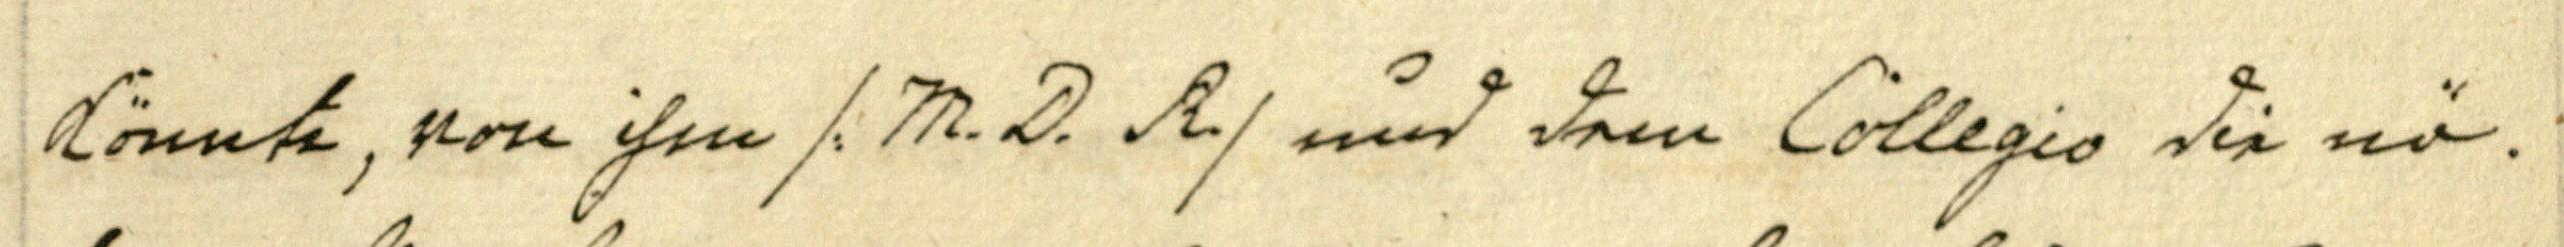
könnte, von ihm /. M. D. R./ und dem Collegio die nö¬
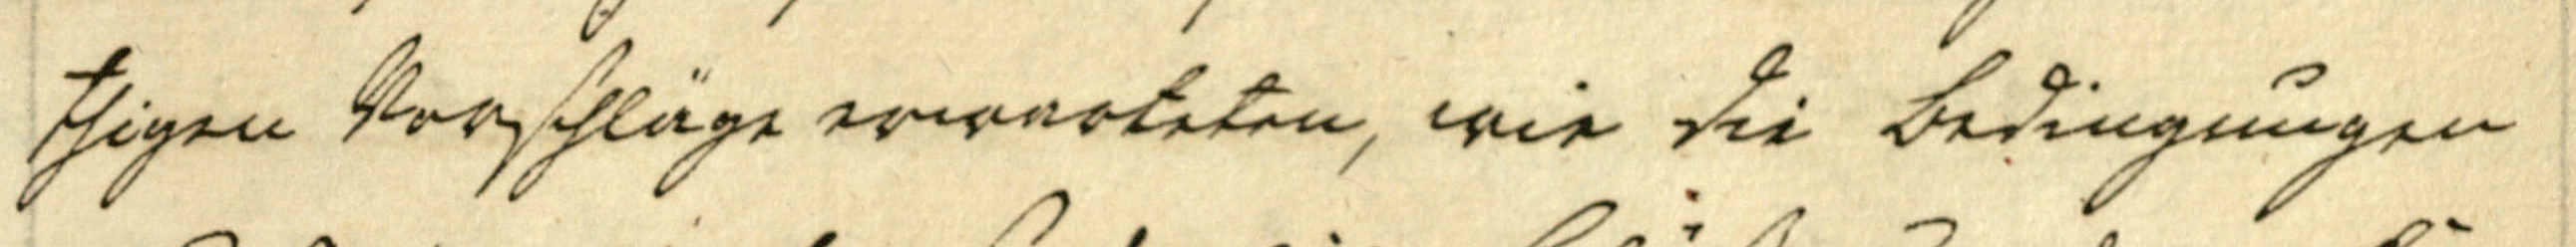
thigen Vorschläge erwarteten, wie die Bedingungen
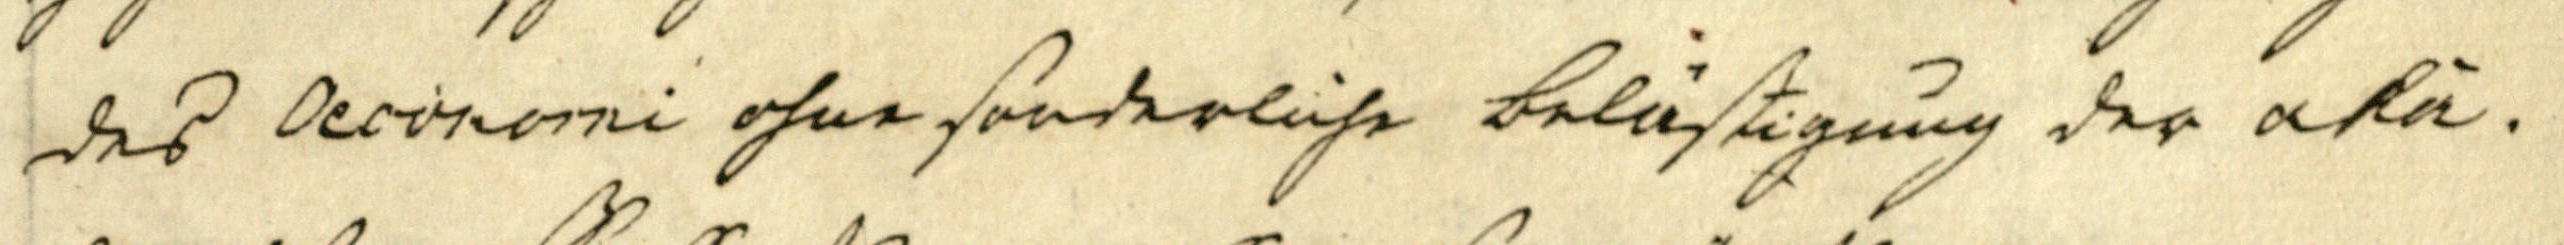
der Oeconomi ohne sonderliche Belästigung der aka¬
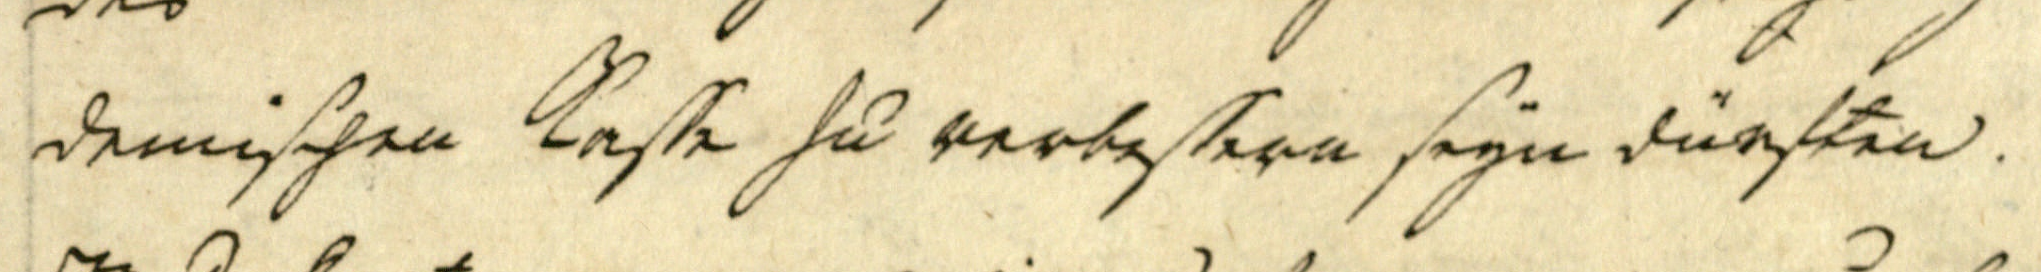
demischen Kasse zu verbessern seÿn dürften.
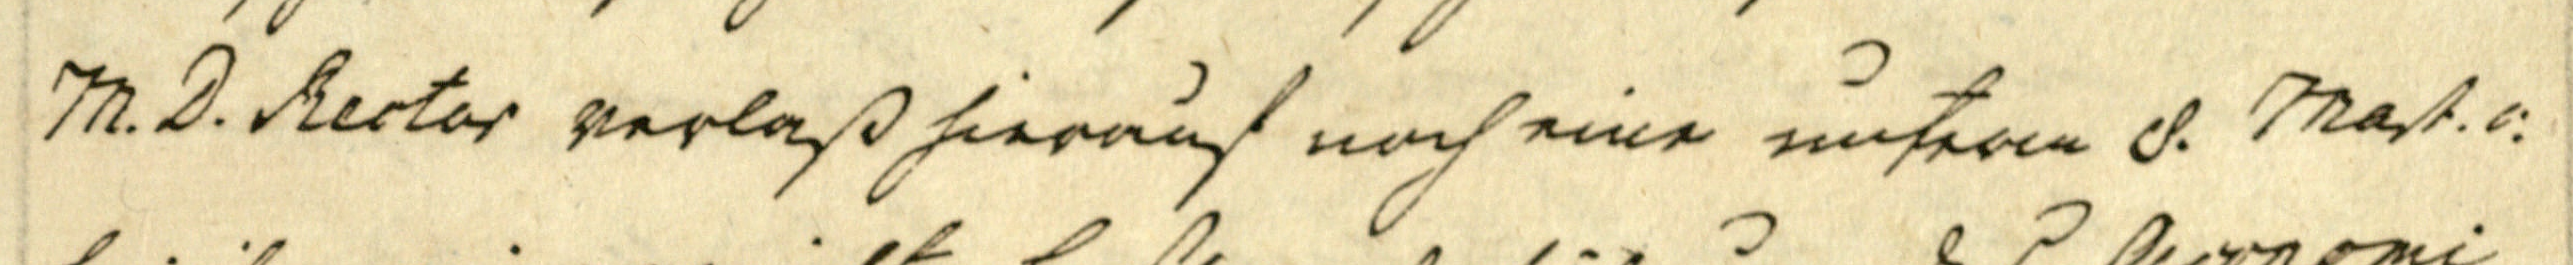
M. D. Rector verlaß hierauf noch eine unterm 8. Mart. c.
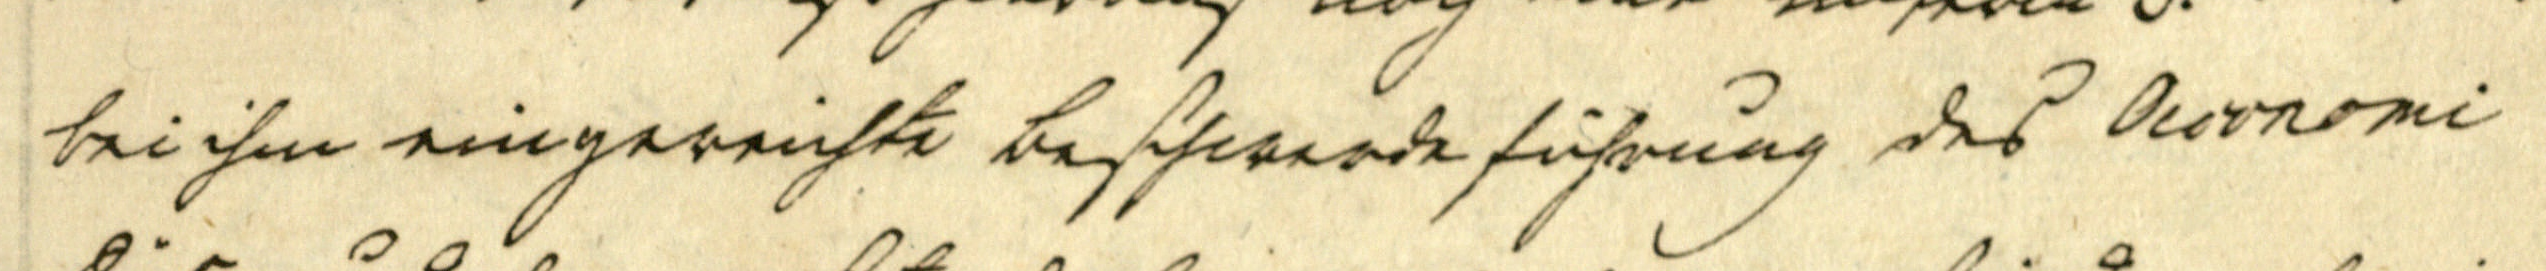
bei ihm eingereichte Beschwerde führung des Oeconomi
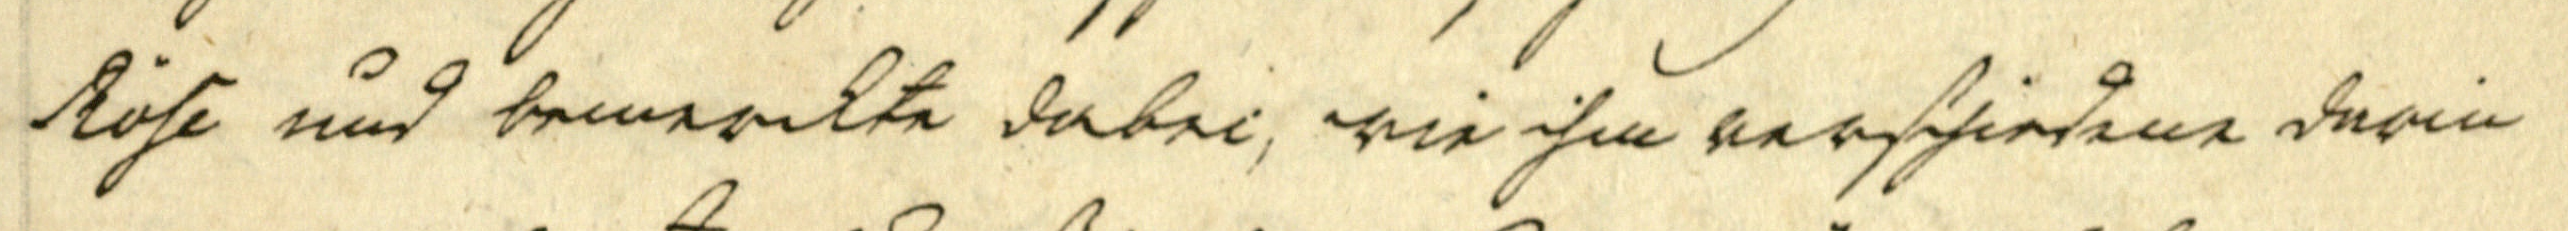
Röse und bemerckte dabei, wie ihm verschiedene darin
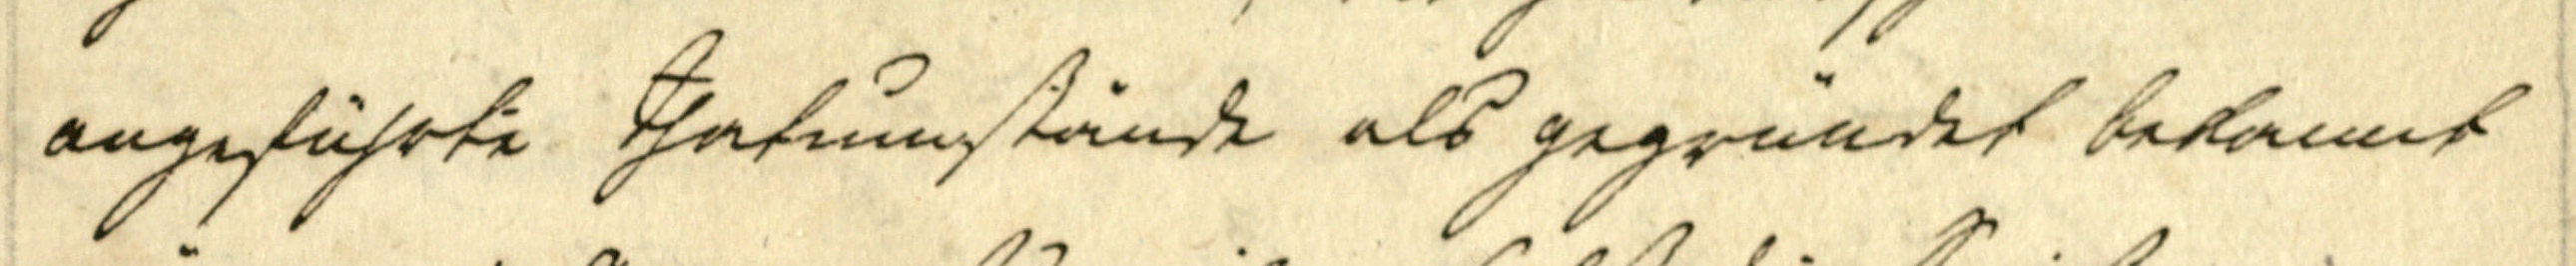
angeführte Thatumstände als gegründet bekannt
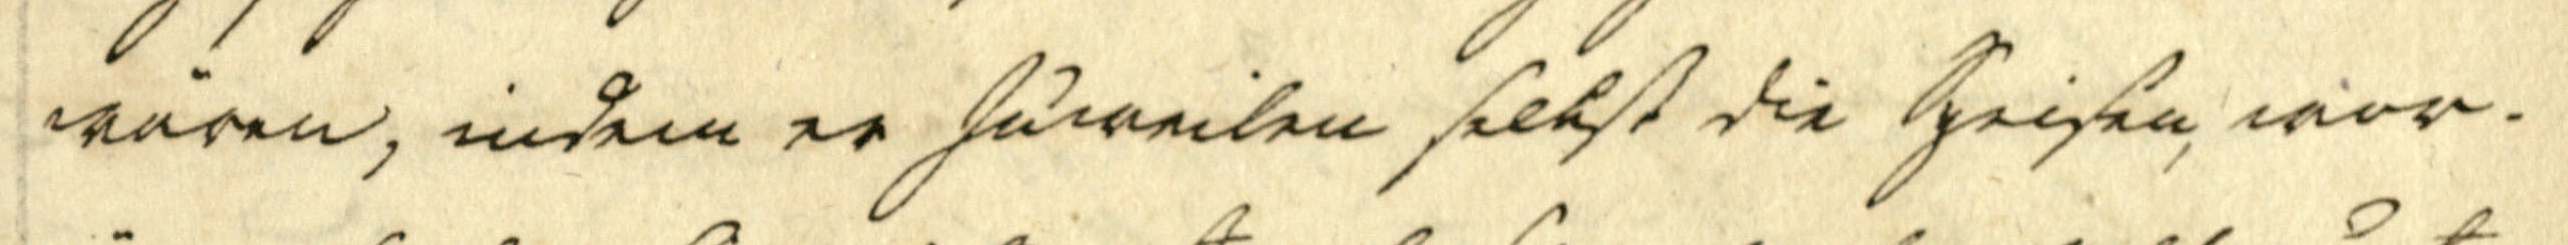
wären, indem er zuweilen selbst die Speisen wor¬
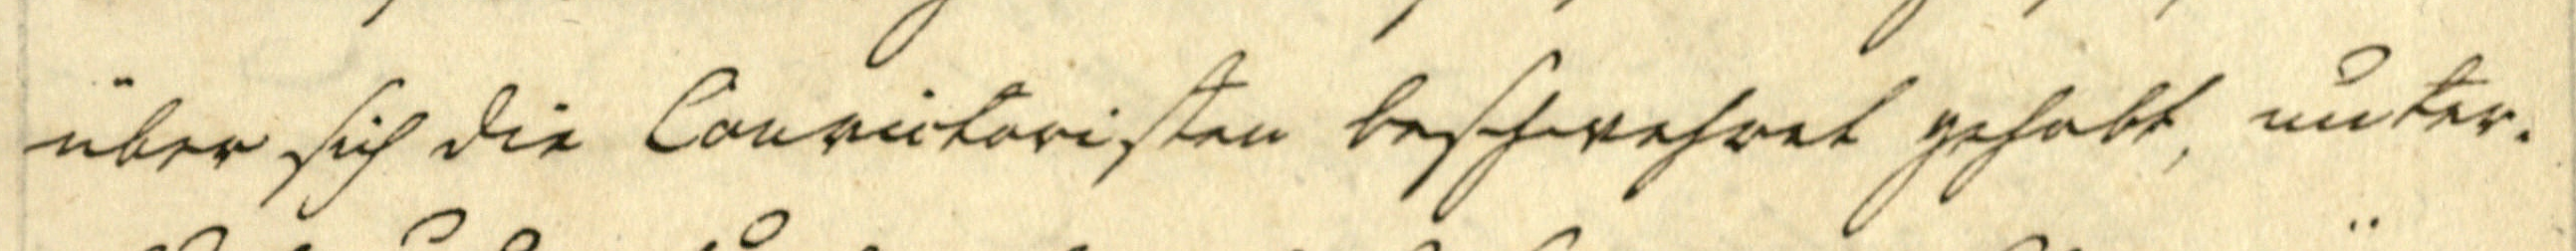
über sich die Convictoristen beschwehret gehabt, unter¬
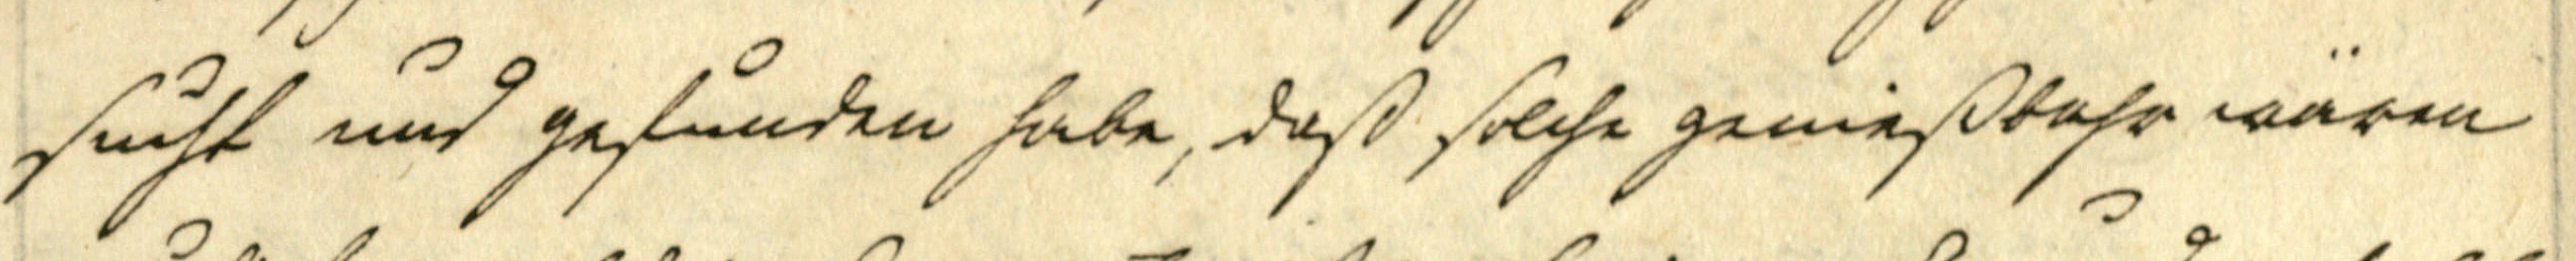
suchte und gefunden habe, daß solche geniesbahr wären
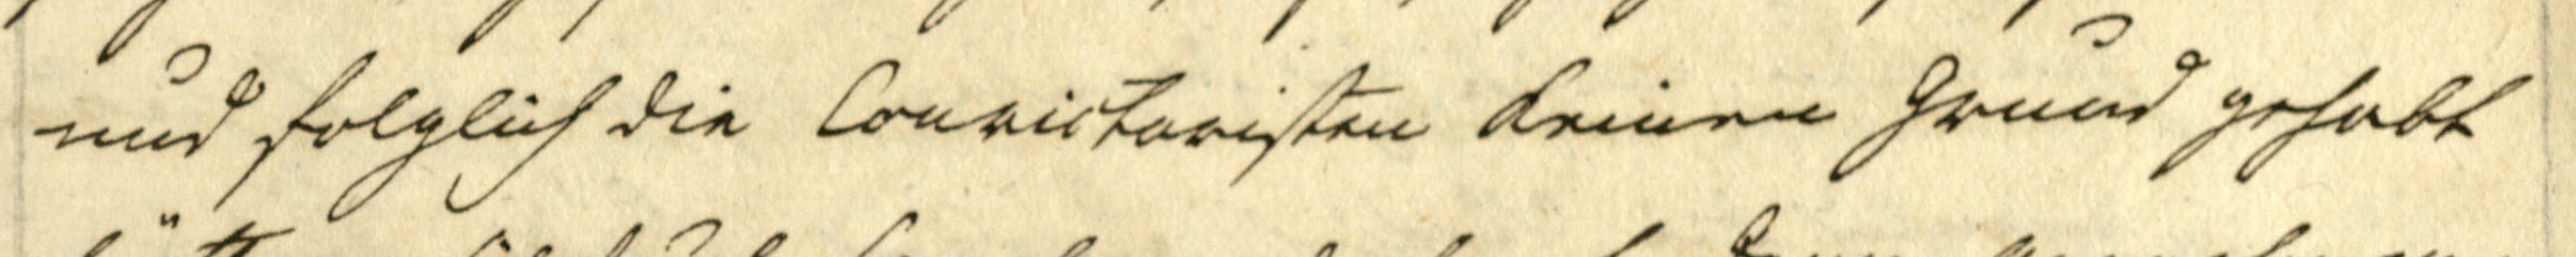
und folglich die Convictoristen keinen Grund gehabt
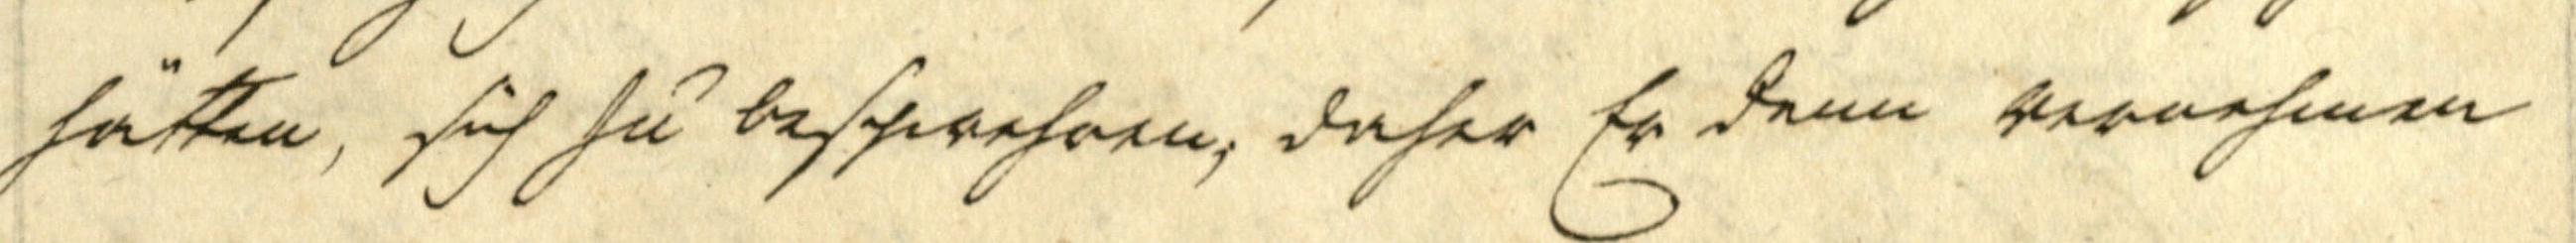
hätten, sich zu beschwehren, daher Er denn vernehmen
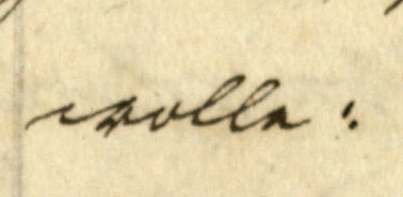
wolle:
